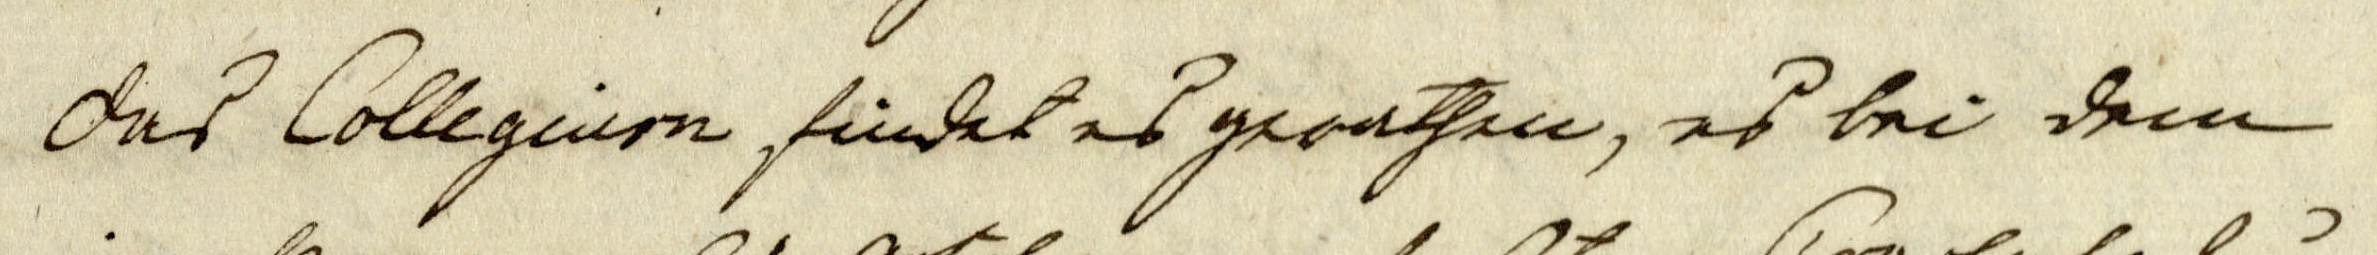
Das Collegium findet es gerathen, es bei dem
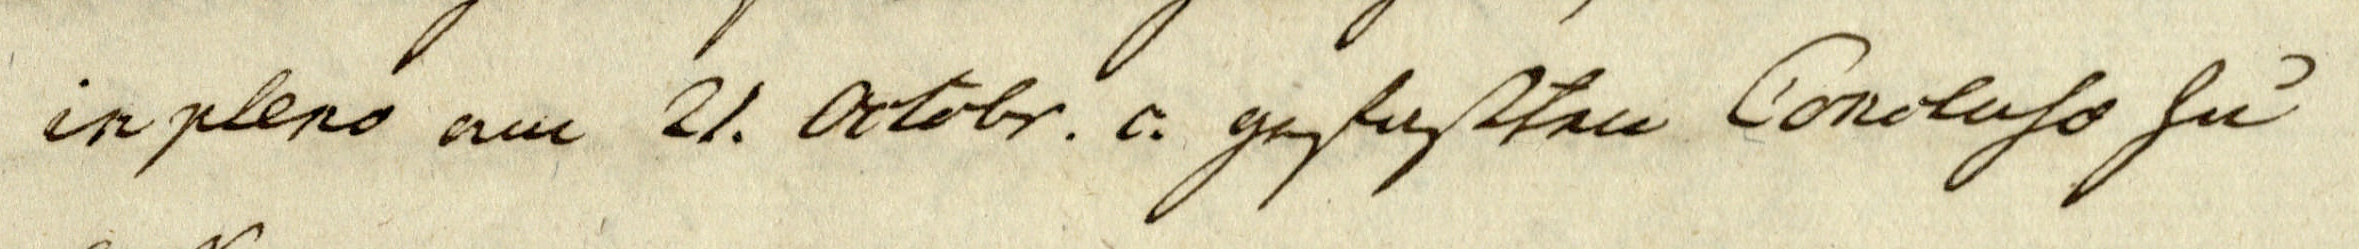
in pleno am 2. Octobr. c. gefaßten Concluso zu
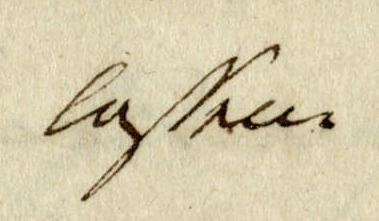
lassen.
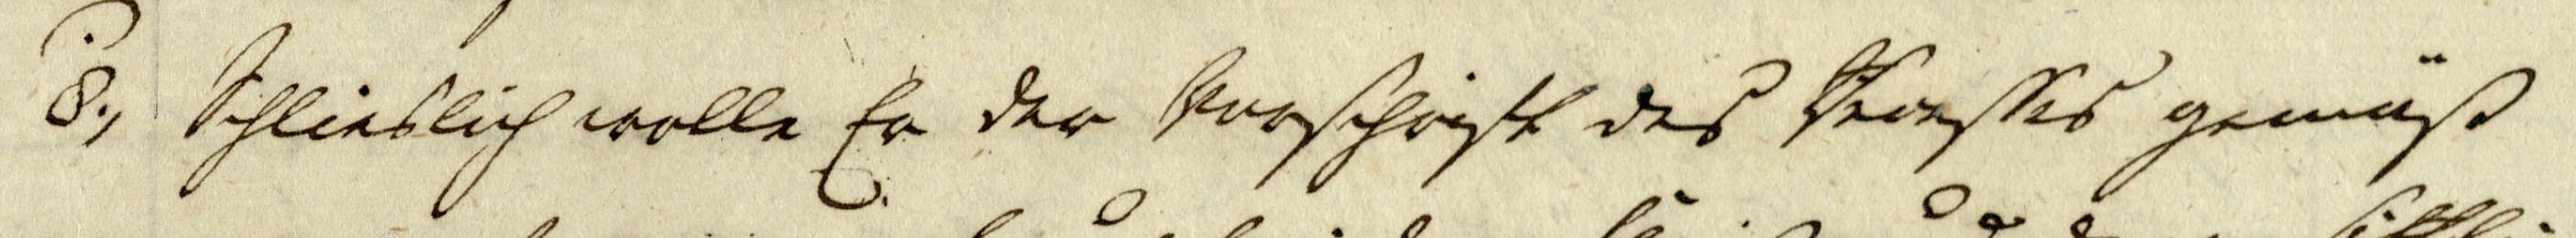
5., Schlieslich wolle Er der Vorschrift des Recesses gemäß
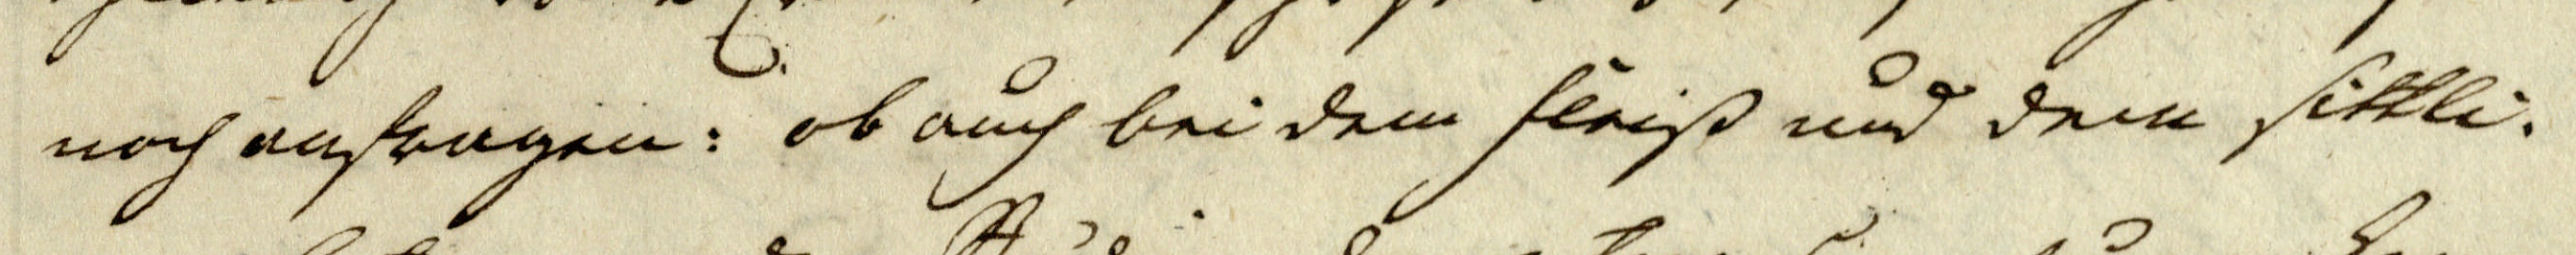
noch anfragen: ob auch bei dem Fleiß und dem sittli¬
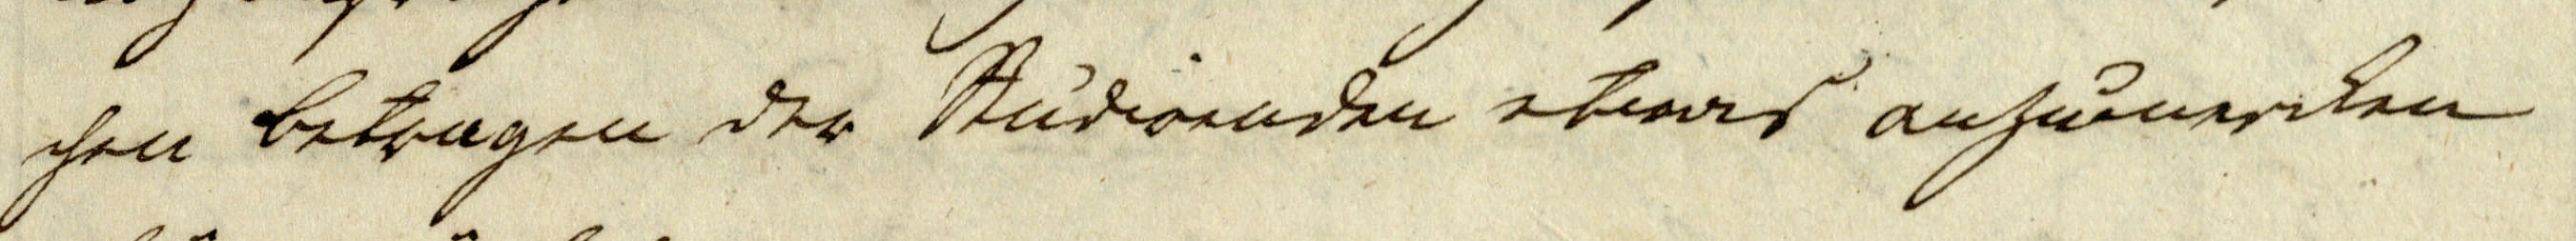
chen Betragen der Studirenden etwas anzumercken
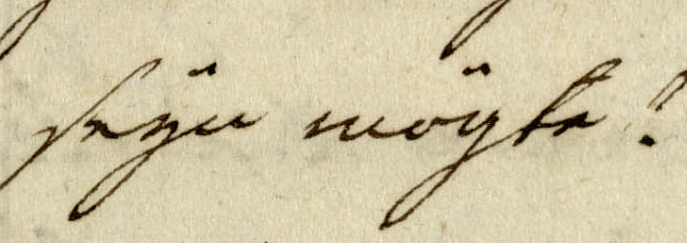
seÿn mögte?
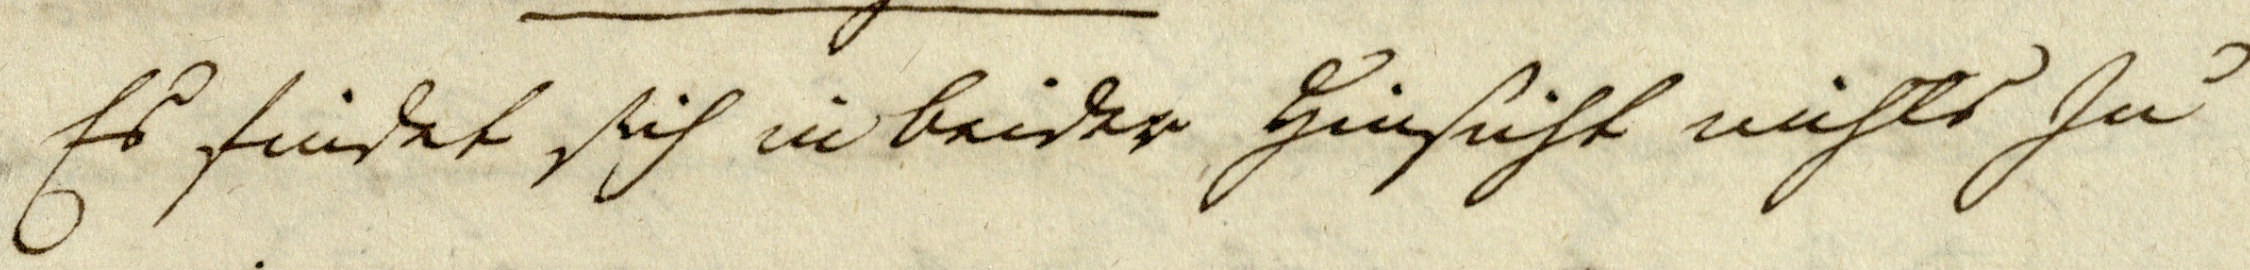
Es findet sich in beider Hinsicht nichts zu
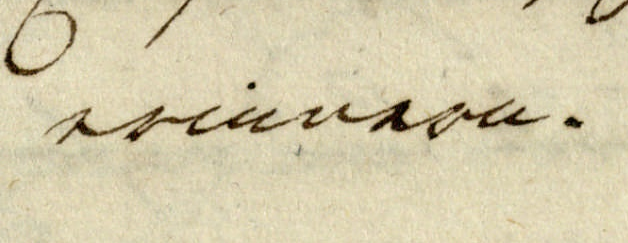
erinnern.
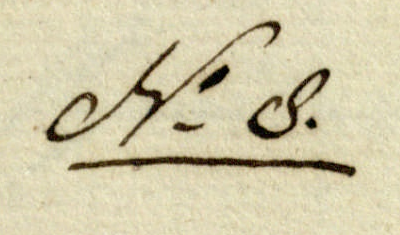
No 8.
